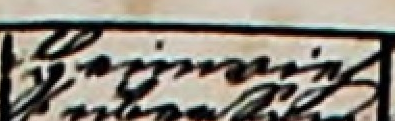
Heimvieh
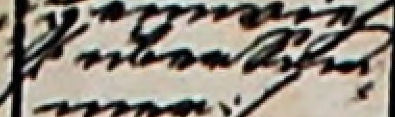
über S???
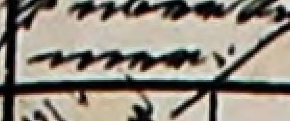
mer.
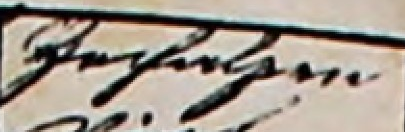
Zechalgen
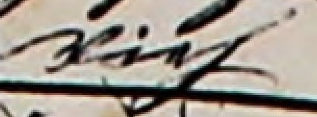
Vieh
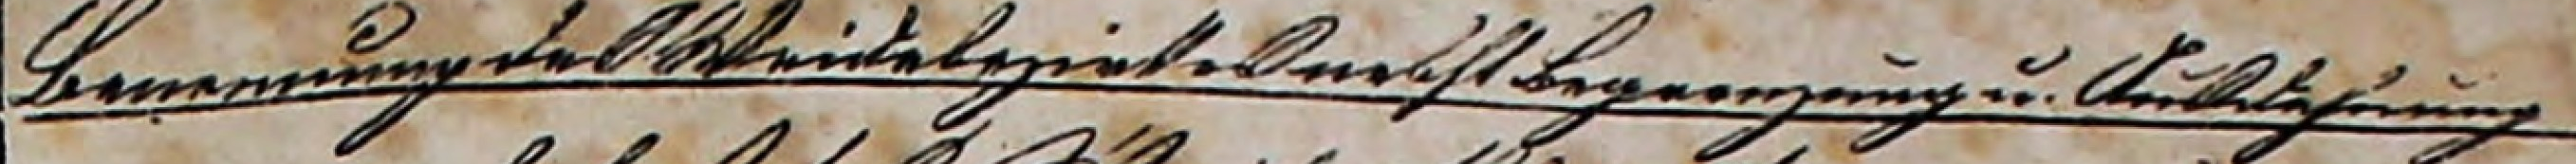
Benennbelaßetes Weide Objektung des Weidabezirkes nebst Begrenzung u. Ausdehnung
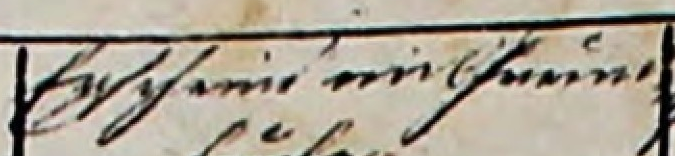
Erscheint im Grund„
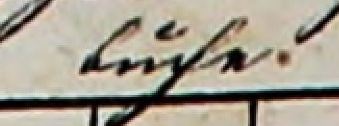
Buche
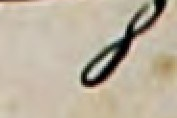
8
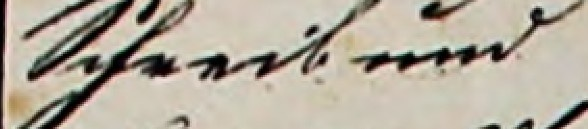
Schreib und
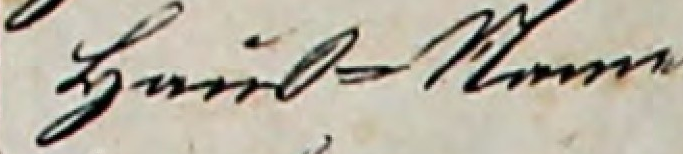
Haus=Name
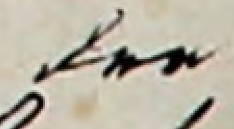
der
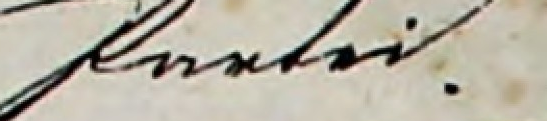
Partei
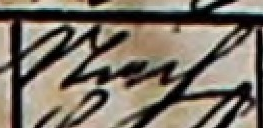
Nach
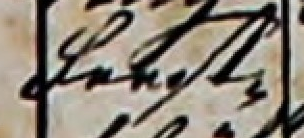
Seest„
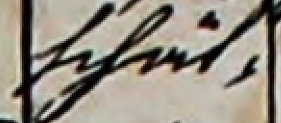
eschät„
